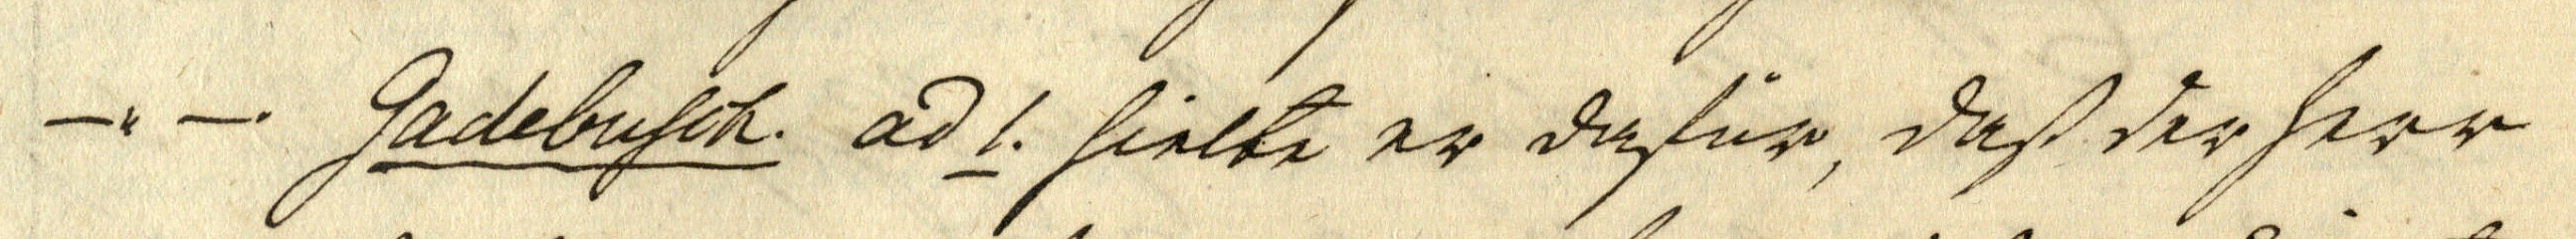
- " - " Gadebusch. ad 1. hielte er dafür, daß der Herr
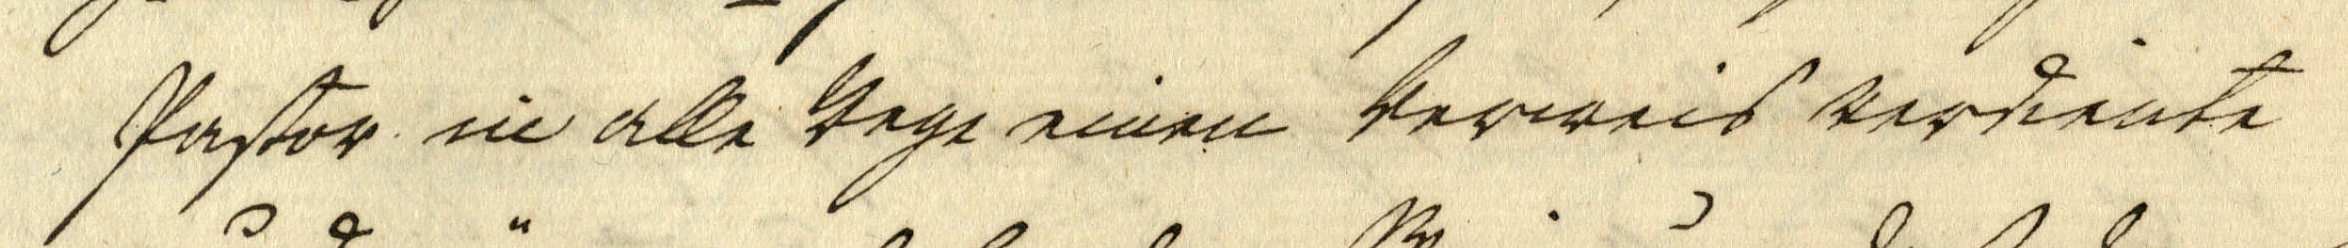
Pastor in alle Wege seinen Verweis verdiente
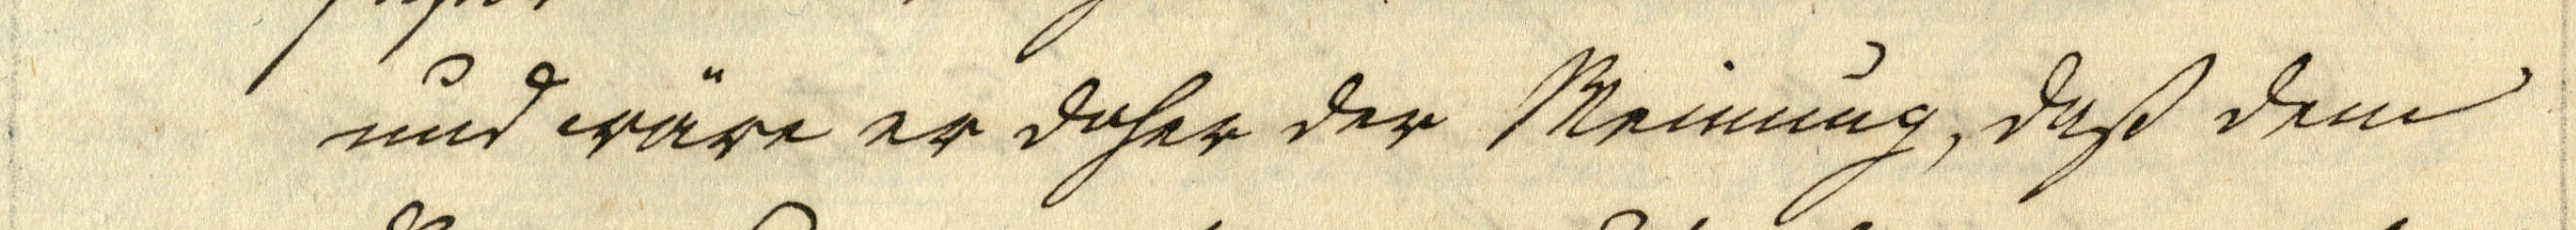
und wäre er daher der Meinung, daß dem
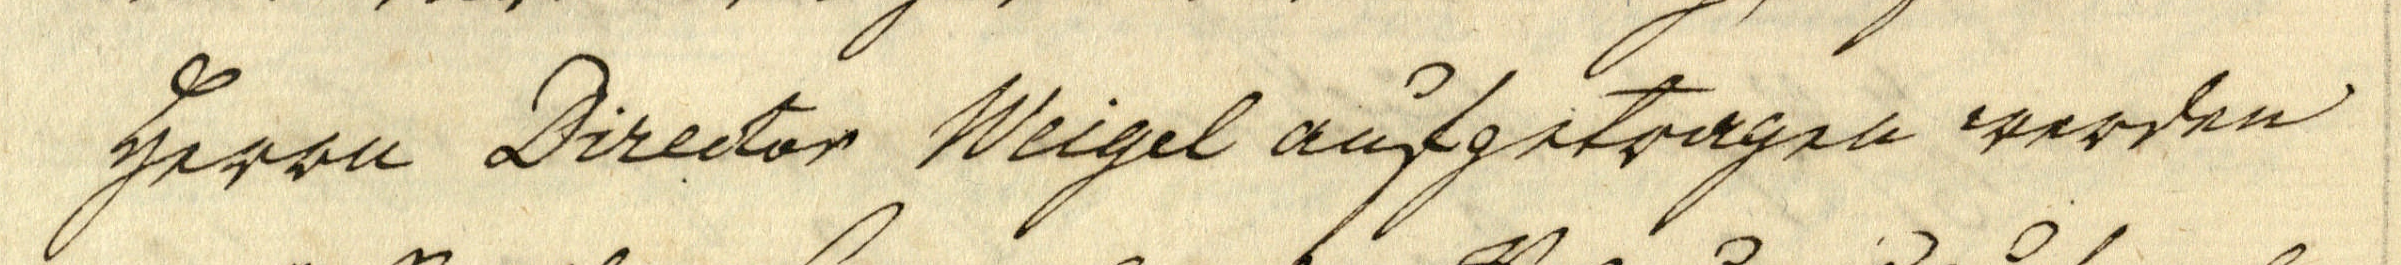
Herrn Director Weigel aufgetragen werden
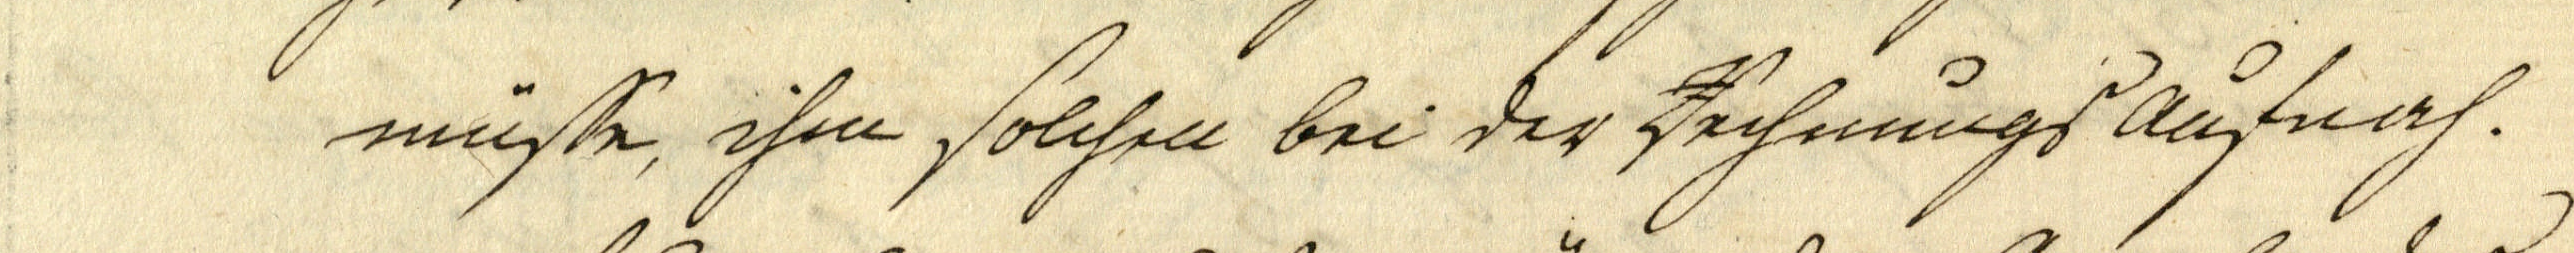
müsse, ihm solchen bei der Rechnungs Aufnah-
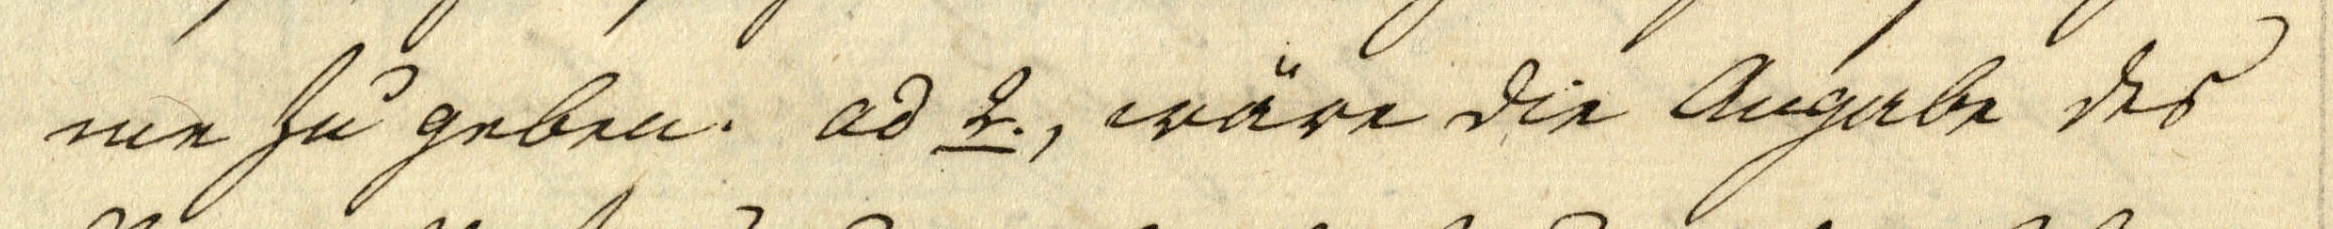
me zu geben. Ad 2., wäre die Angabe des
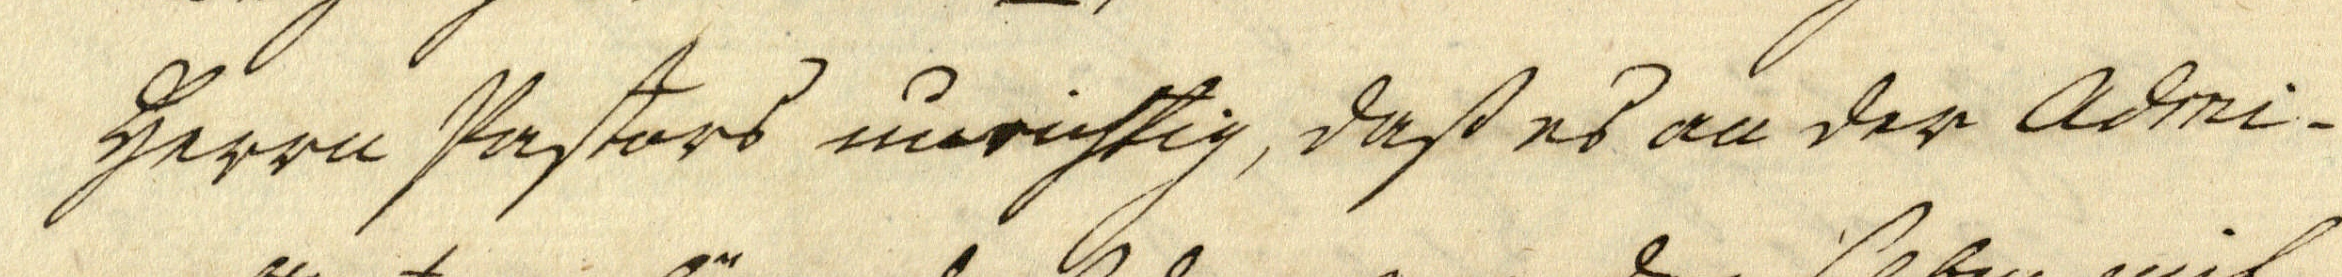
Herrn Pastors unrichtig, daß es an der Admi-
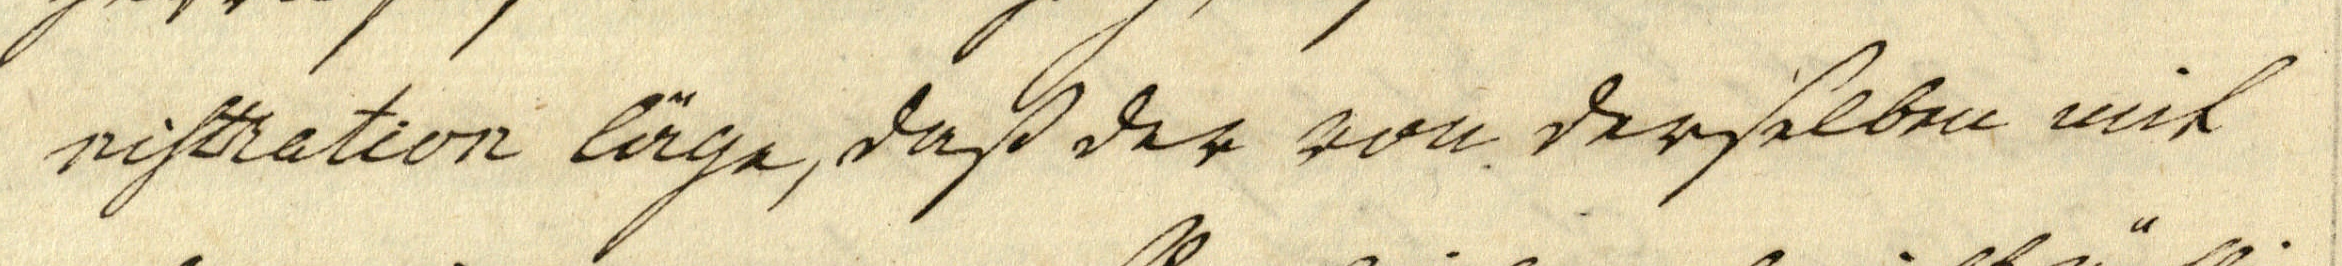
nistration läge, daß der von derselben mit
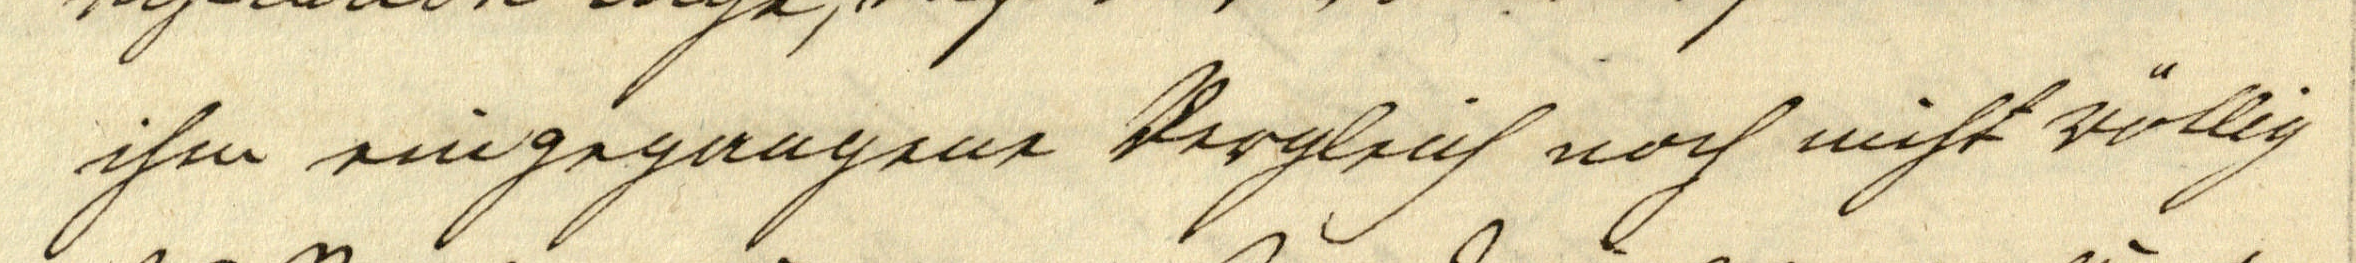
ihm eingegangene Vergleich noch nicht völlig
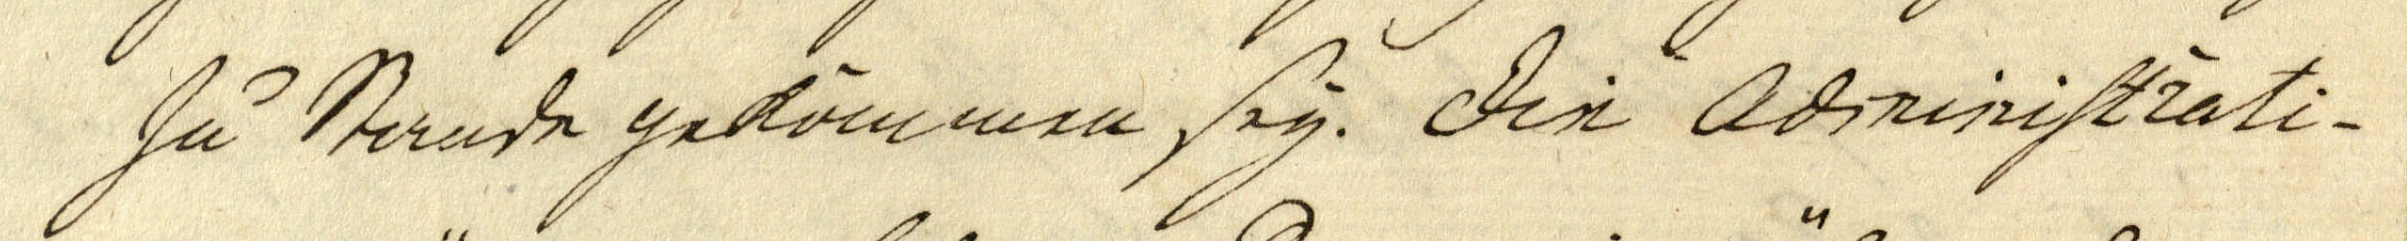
zu Stande gekommen sey. Die Administrati-
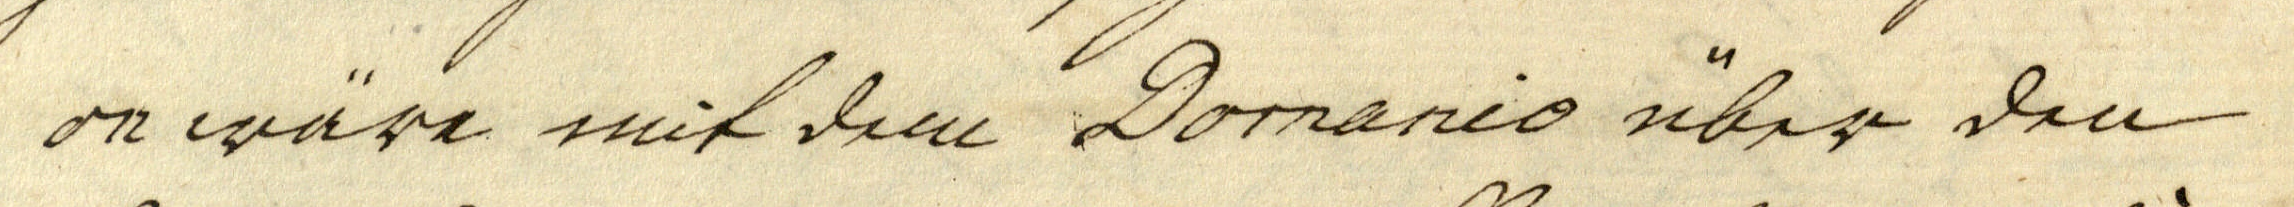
on wäre mit dem Domanio über den
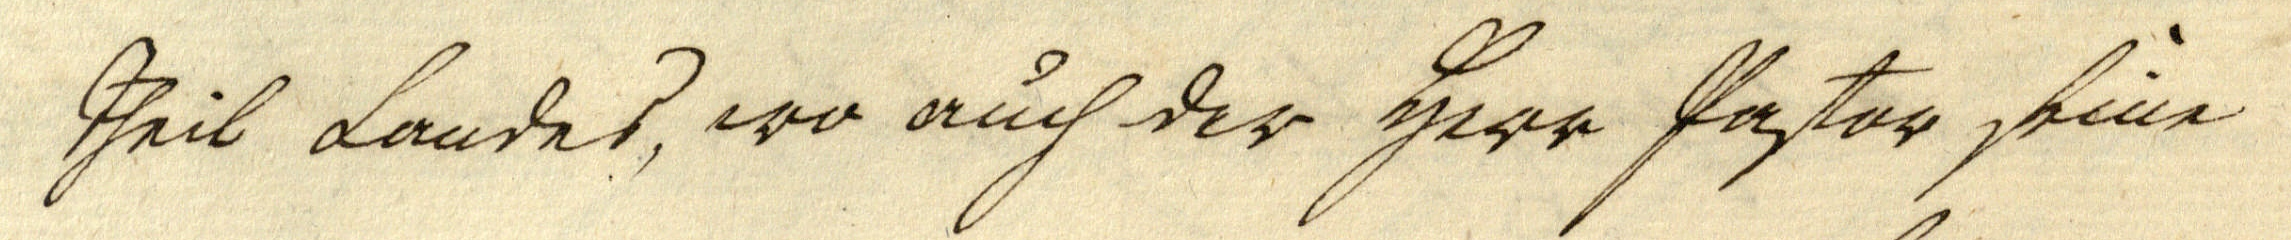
Theil Landes, wo auch der Herr Pastor seine
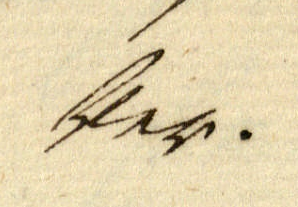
Ver-
